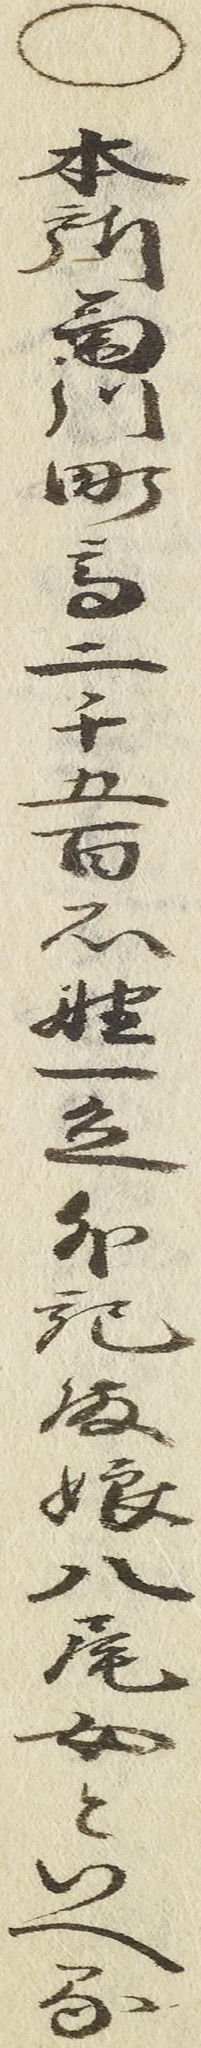○本所菊川町高二千五百石野一色外記殿八尾女といへる
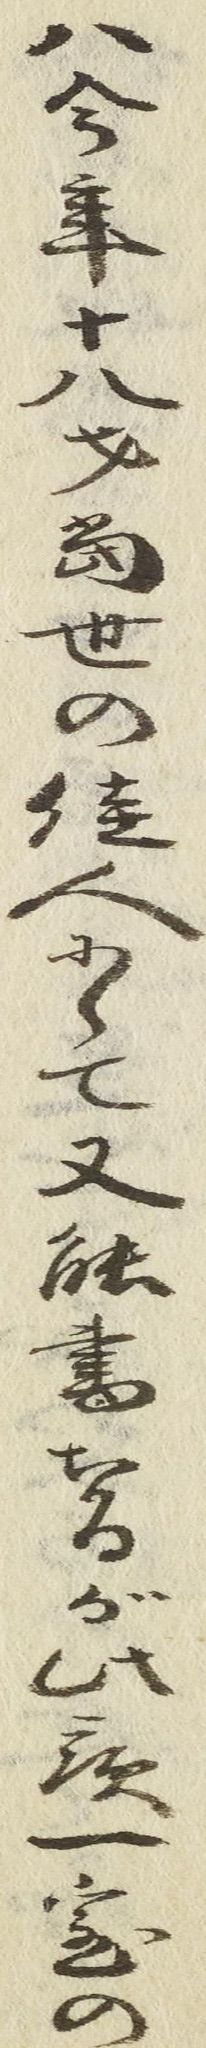は今年十八才当世の佳人にして又能書なるが此夜一室の
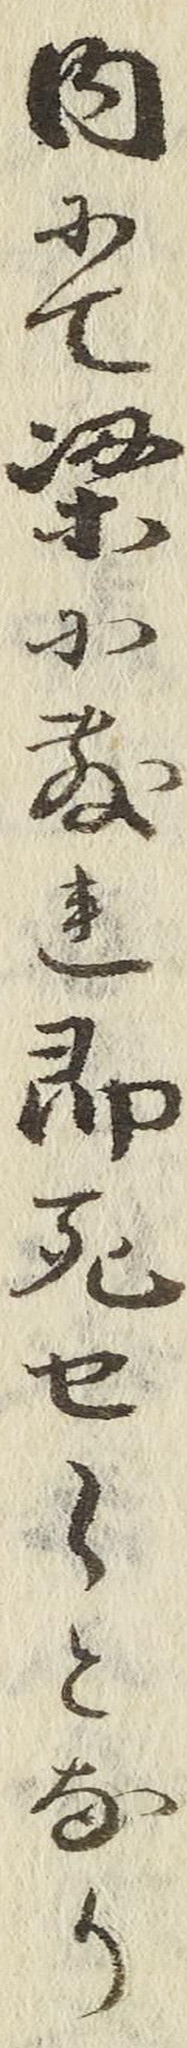内にて梁に敷れ即死せしとなり
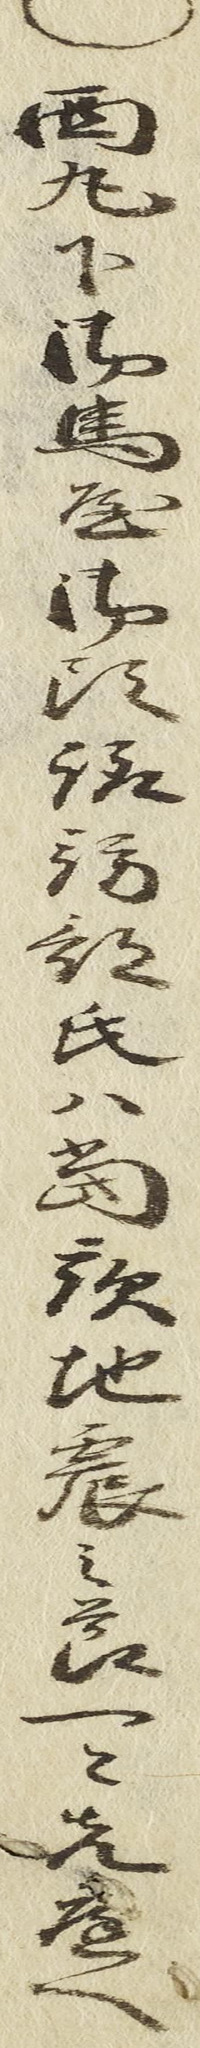○西丸下御馬屋御頭諏訪部氏は当夜地震之節一と先庭へ
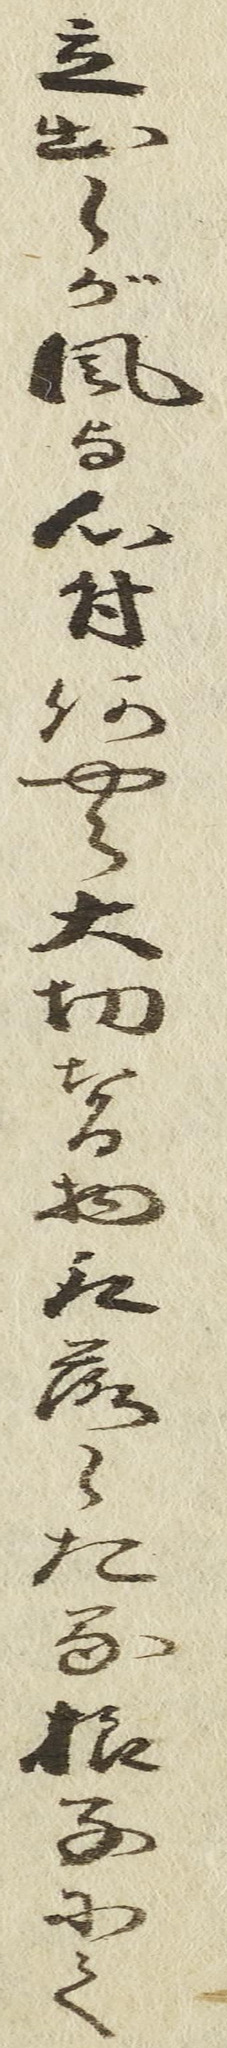立出しが風与心付何やら大切なる物取落したる様子にて
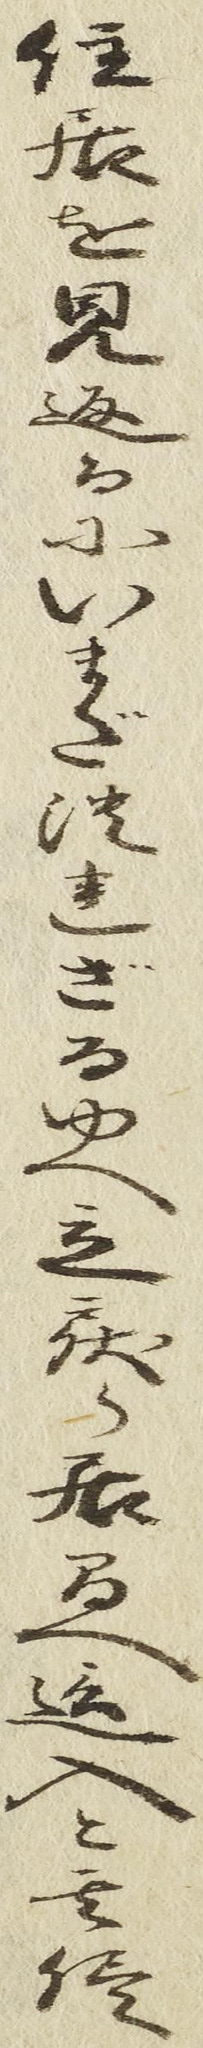住居を見返るにいまだ潰れざるゆへ立戻り居間へ這入と其儘
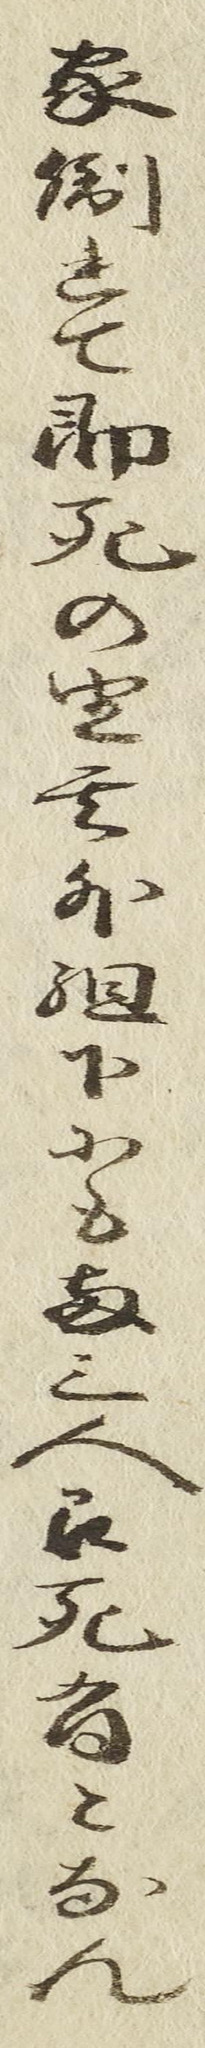家倒れて即死の由其外組下にも両三人即死有となん
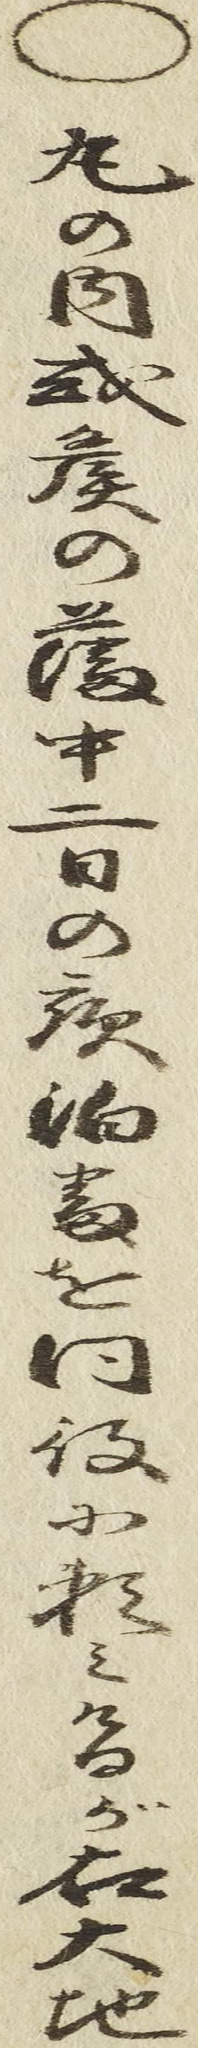○丸の内或侯の藩中二日の夜泊番を同役に頼みけるが右大地
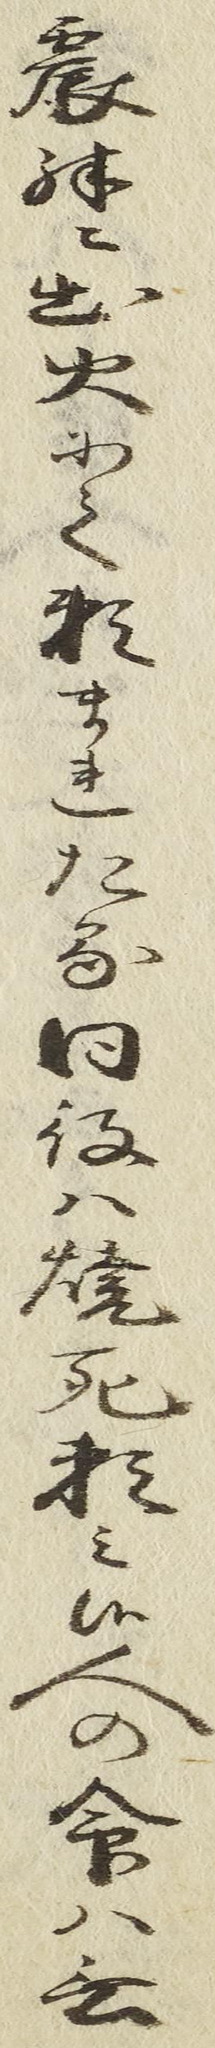震殊ニ出火にて頼まれたる同役は焼死頼み候人の命は無
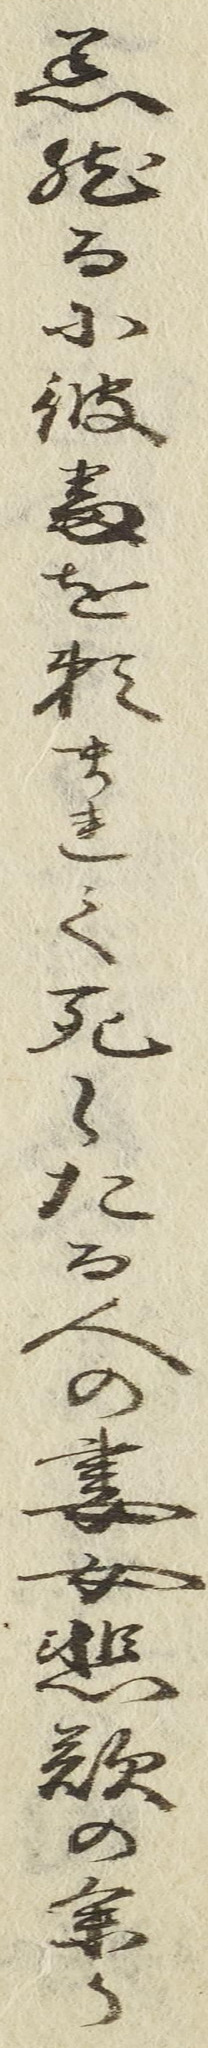恙然るに彼番を頼まれて死したる人の妻女悲歎の余り
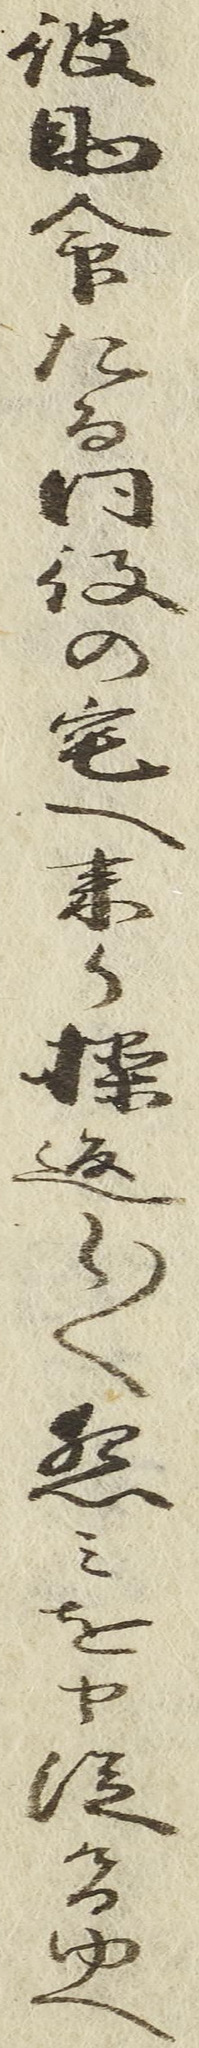彼助命たる同役の宅へ来り繰返し〳〵怨みを申泣けるゆへ
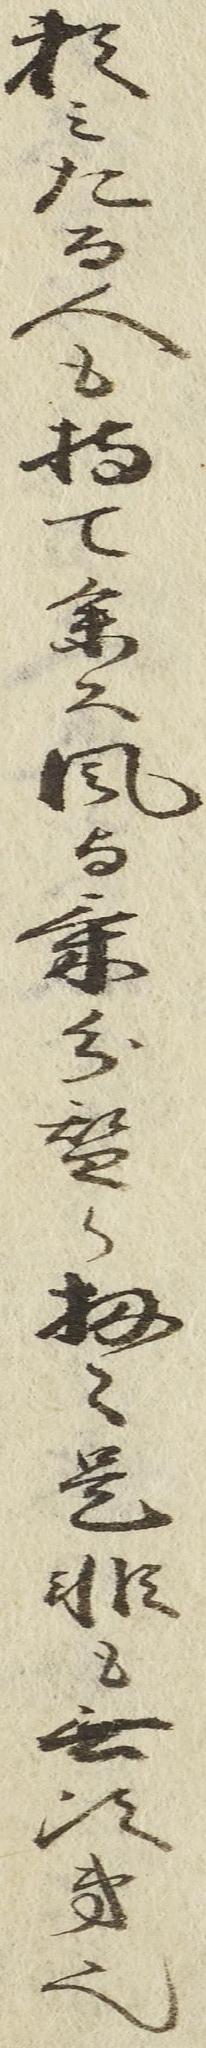頼みたる人も持て余ス風与気分替り扨々是非も無次第也
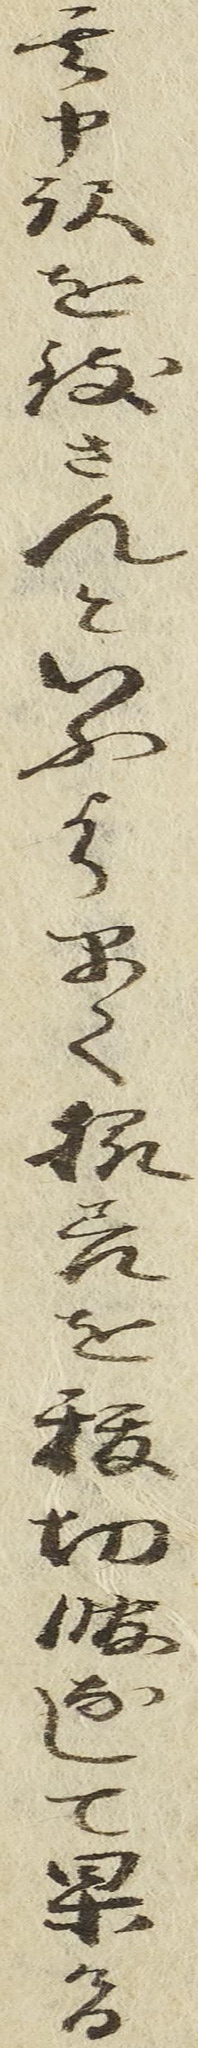其申訳を致さんといふより早く脇差を抜切腹なして果ける

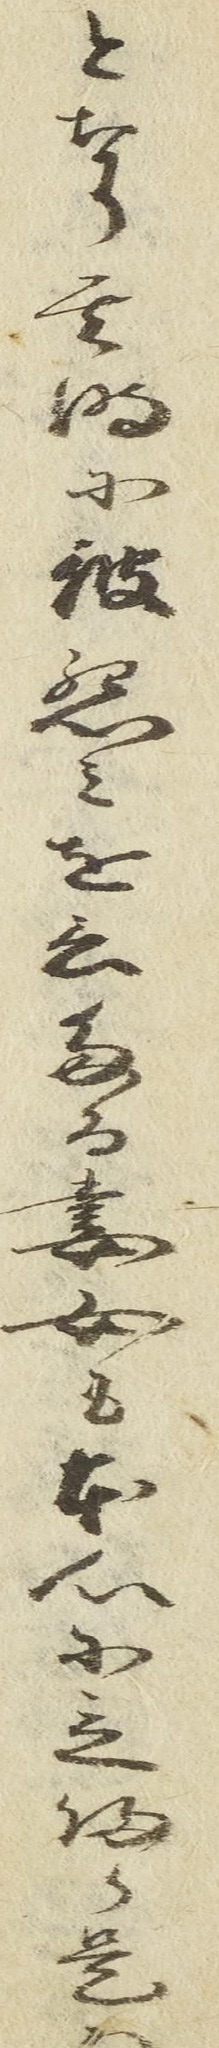となり其時に彼怨みを言たる妻女も本心に立帰り是は
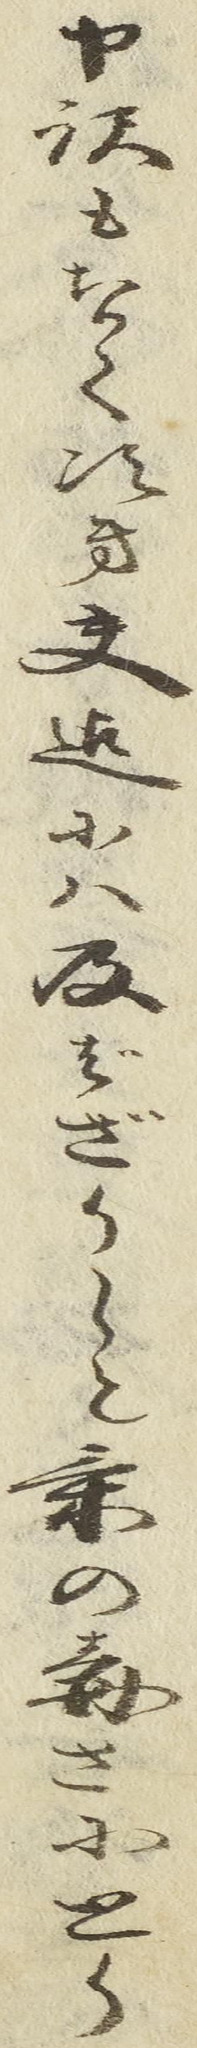申訳もなく次第夫迄には及ばざりしと気の毒さにとり
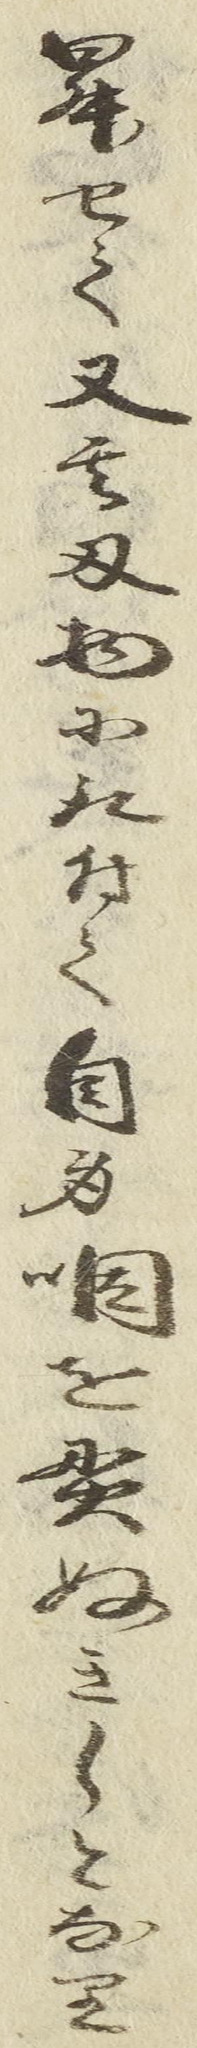昇せて又其刃物に取付て自身咽を貫ぬきしとなり
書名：安政二年震災記事　完
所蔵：東京大学地震研究所図書室 Earthquake Research Institute Library, The University of Tokyo, JAPAN
